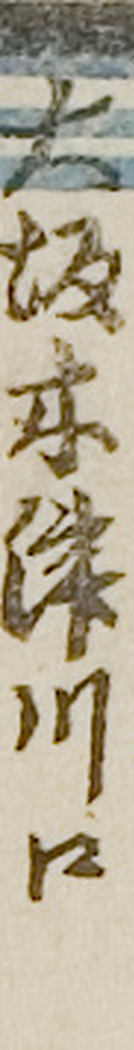大阪木津川口
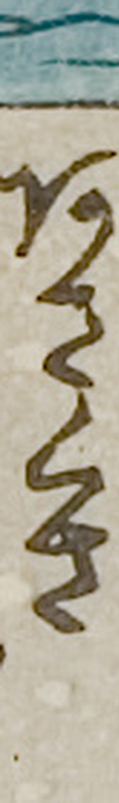あさくさ
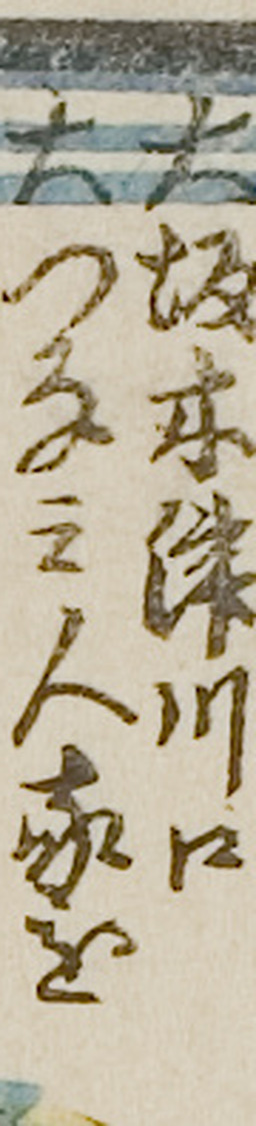大つなみ人家を
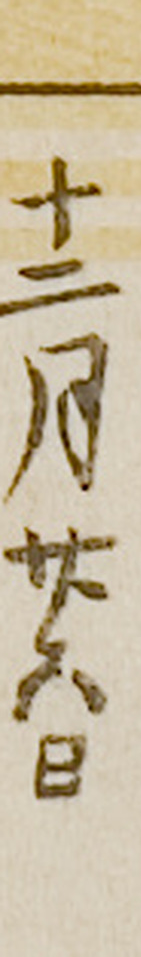十二月廿五日
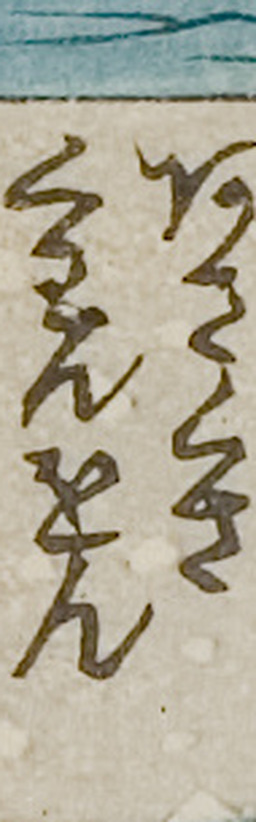くわんをん
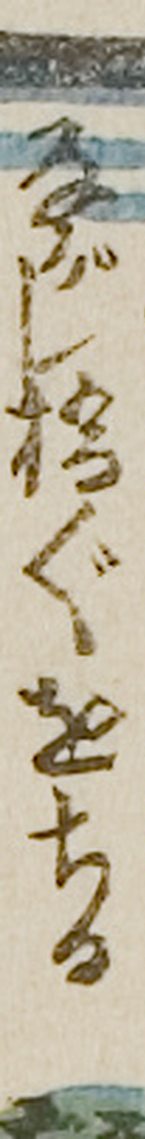ながし橋〴〵をちる
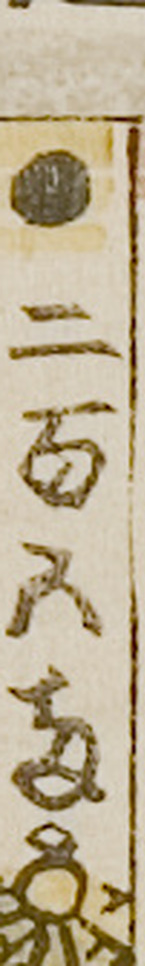●二百五両
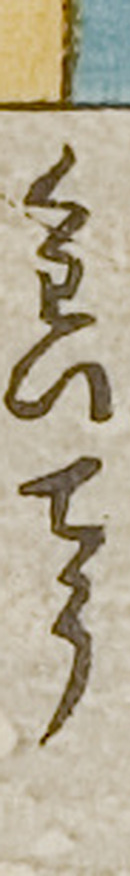くわいてう
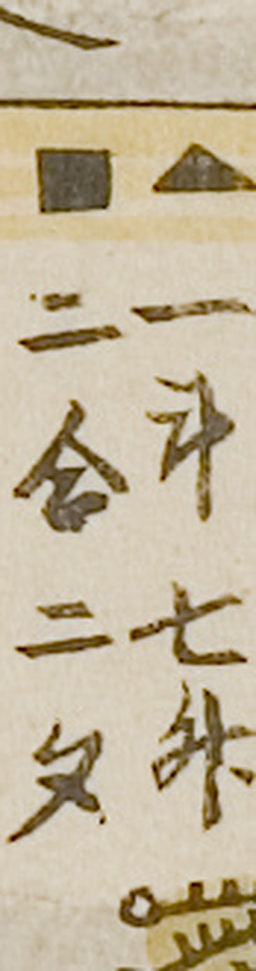二合二勺
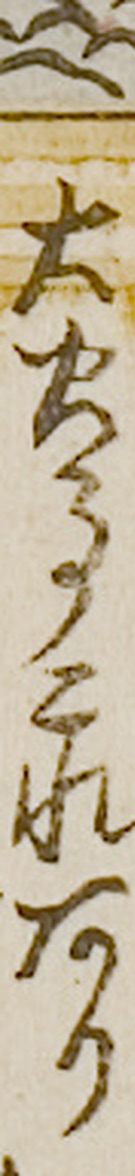大火事これあり
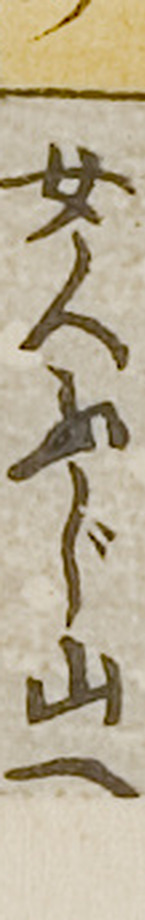女人ふじ山へ
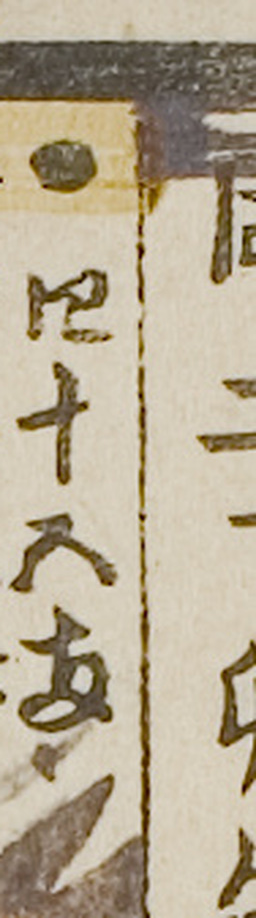●四十五両
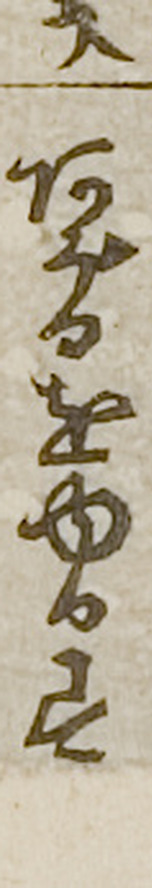あがるをゆるす
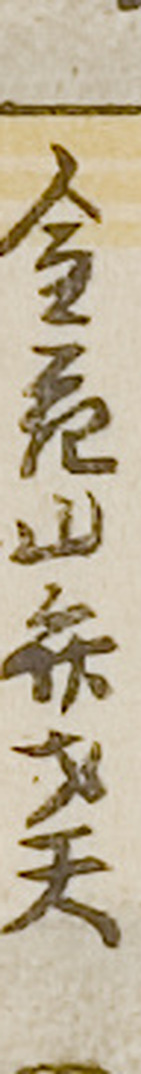金花山弁才天
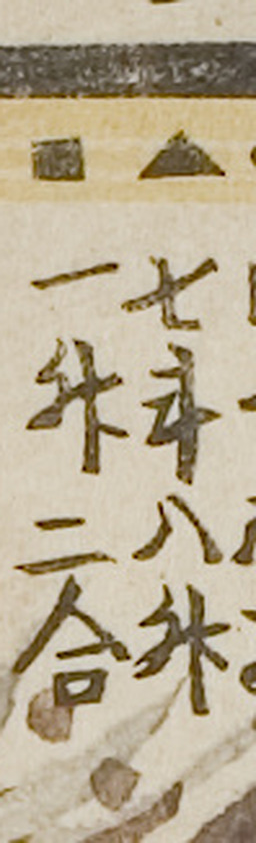一升二合
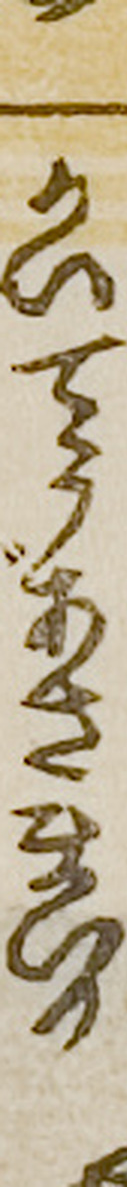かいてうあさまいり
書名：嘉永年間より米相場直段并年代記書抜大新版
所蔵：東京大学総合図書館 General Library in the University of Tokyo, JAPAN
